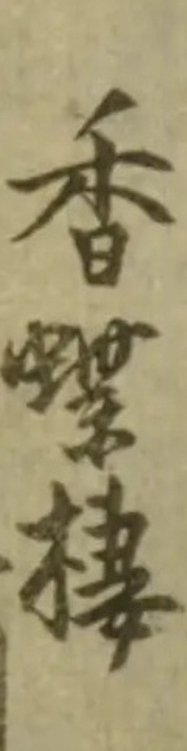香蝶棲
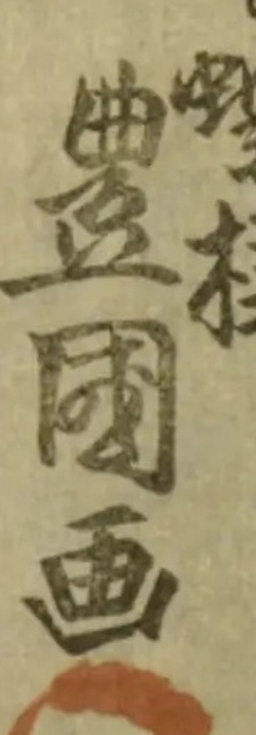豊国画
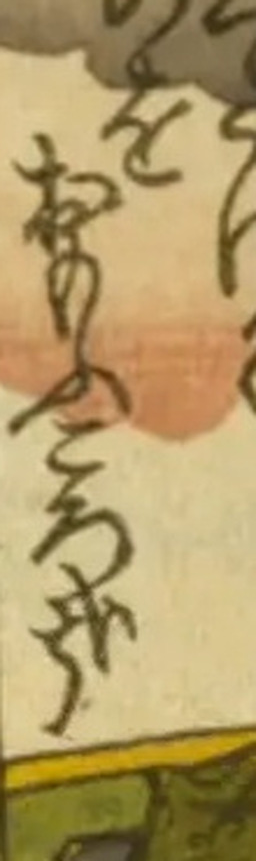おもふころ哉
